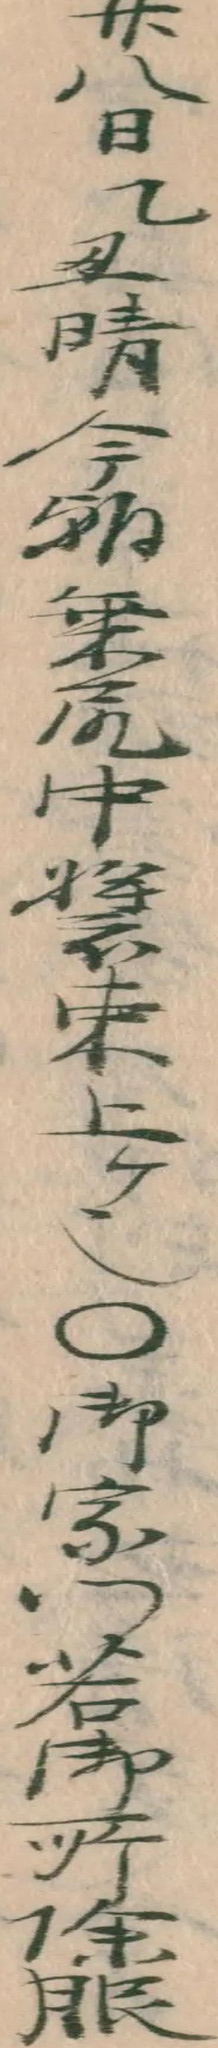廿八日乙丑晴今朝乗尻中装束上ケ也〇御家門若御所除服
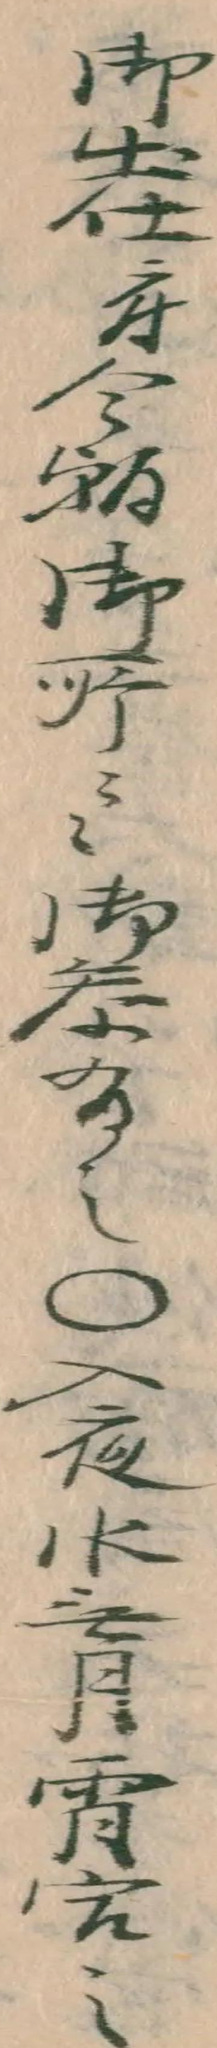御出仕ニ付今朝御所々々御参有之〇入夜水無月宵宮之
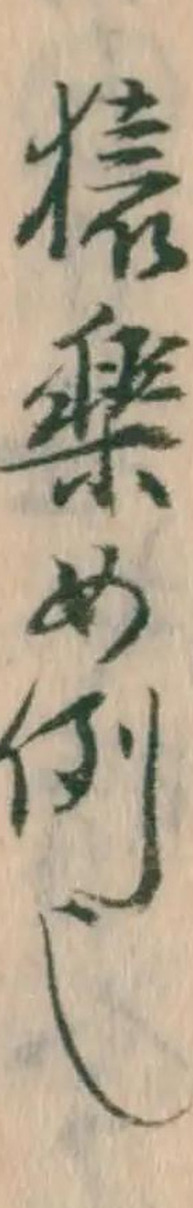猿楽如例也
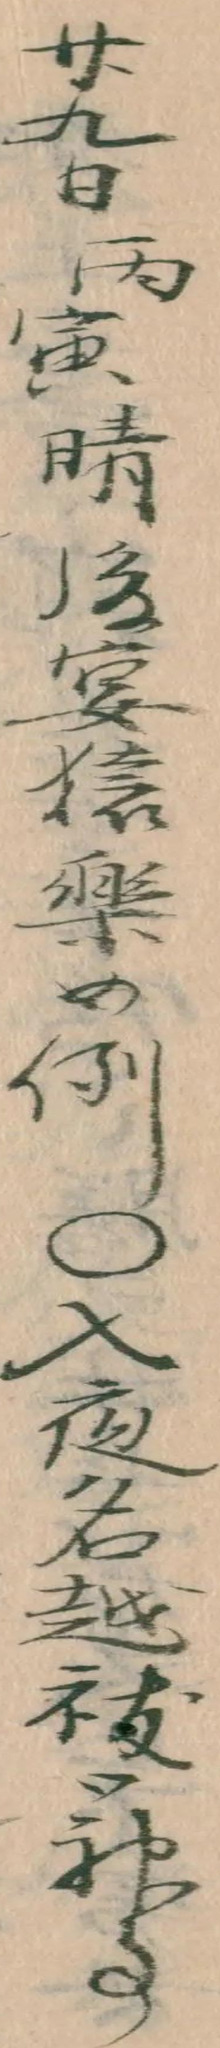廿九日丙寅晴後宴猿楽如例〇入夜名越祓御神事
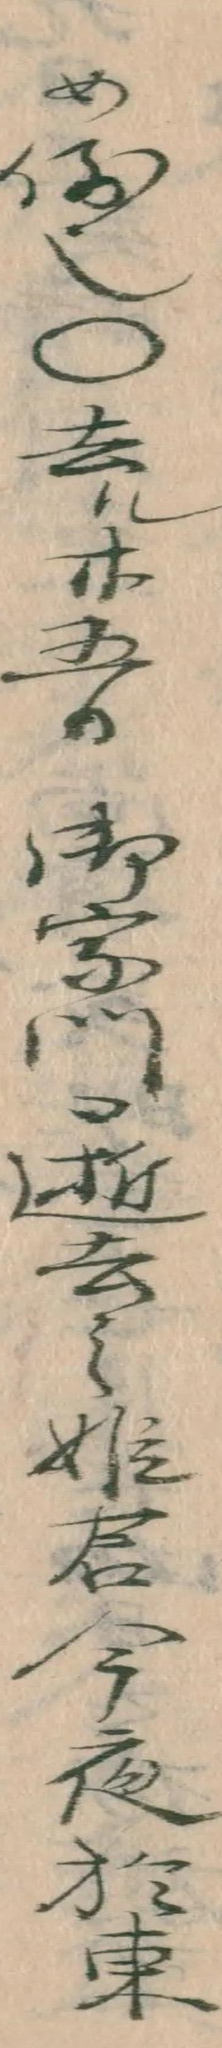如例也○去ル廿五日御家門御逝去之姫君今夜於東
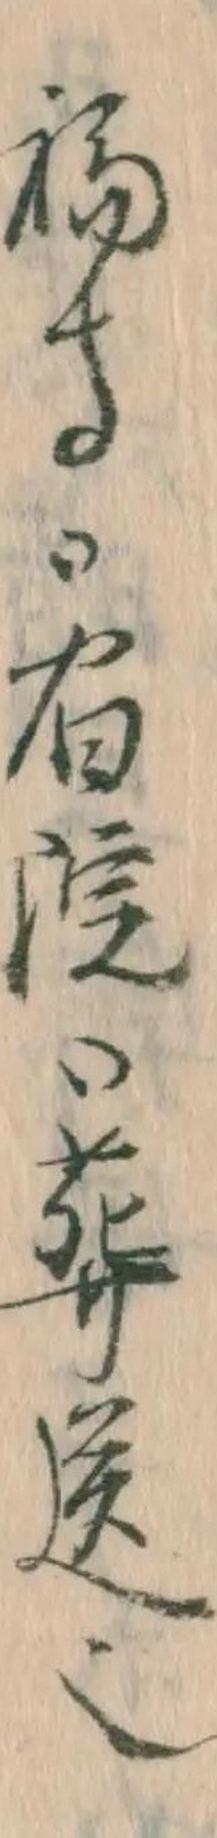福寺御宿院御葬送也
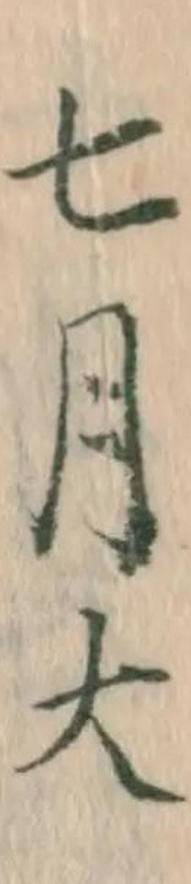七月大
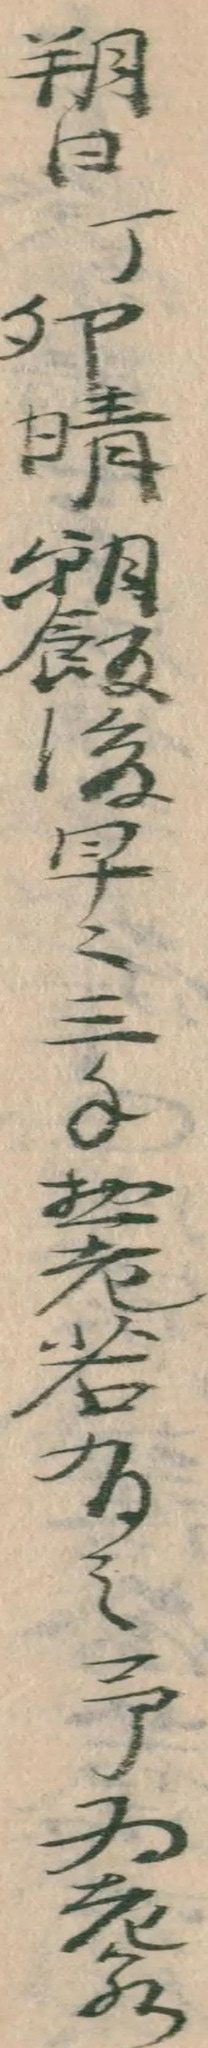朔日丁卯晴朝飯後早〻三手惣老若有之予為老若
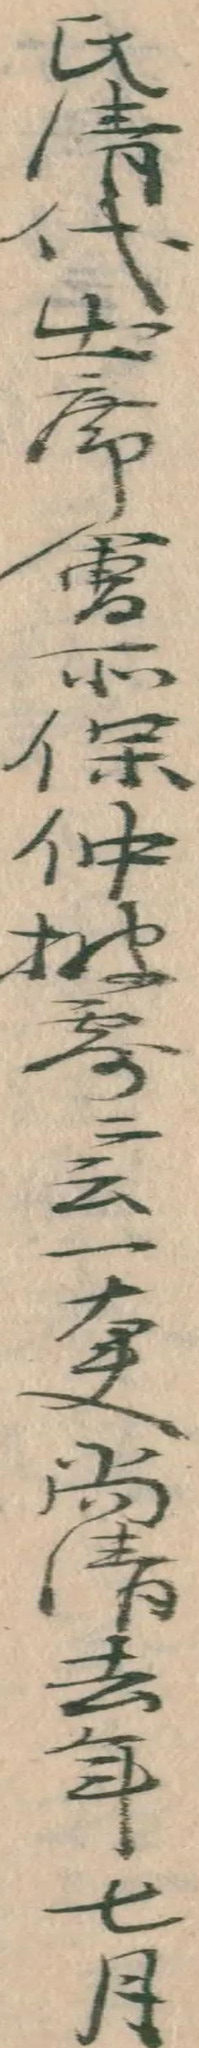氏清代出席会所保仲披露ニ云一大夫尚清去年七月
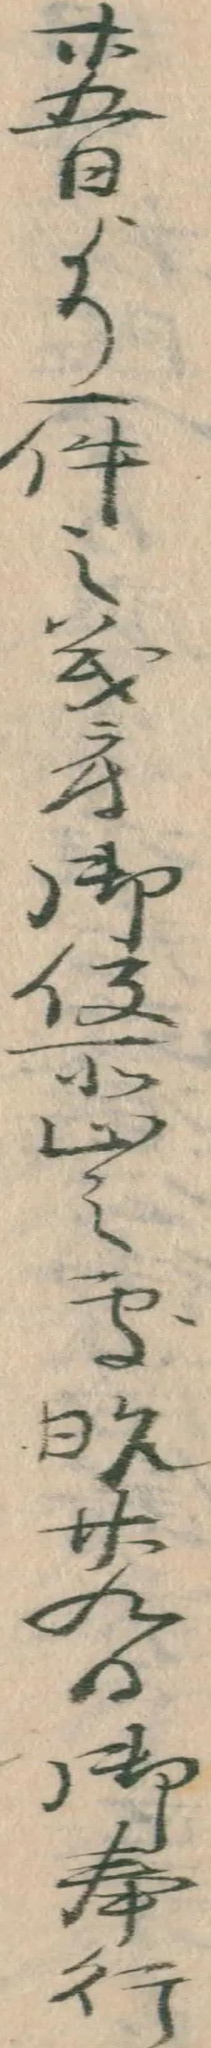廿五日より一件之義ニ付御役所止之処昨廿九日御奉行
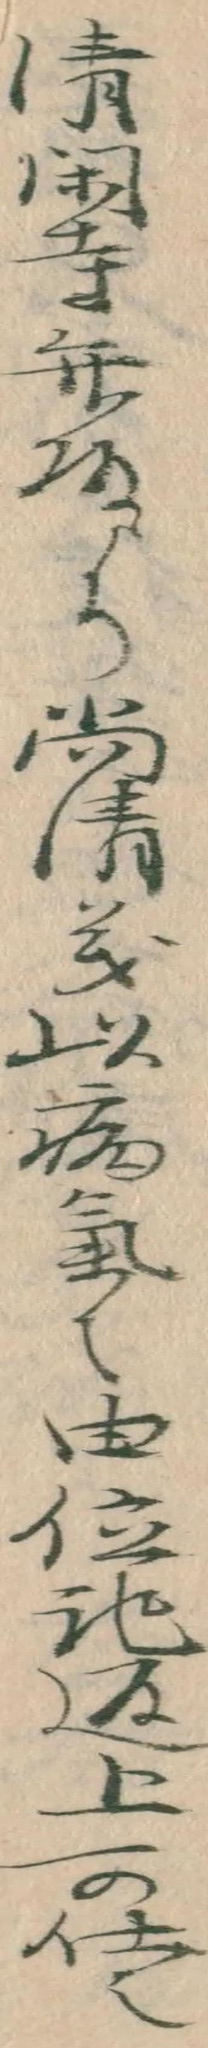清閑寺弁殿より尚清義以病気之由位記返上可仕之
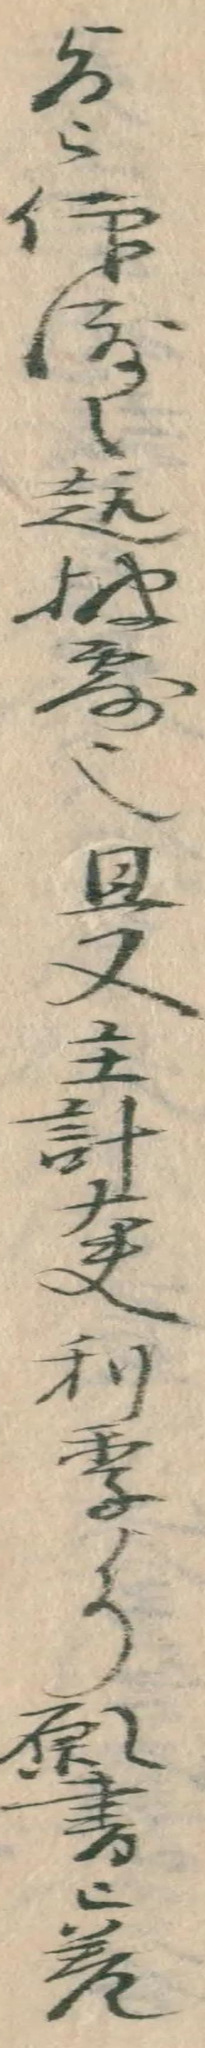旨被仰渡之趣披露也且又主計大夫利季より願書被差
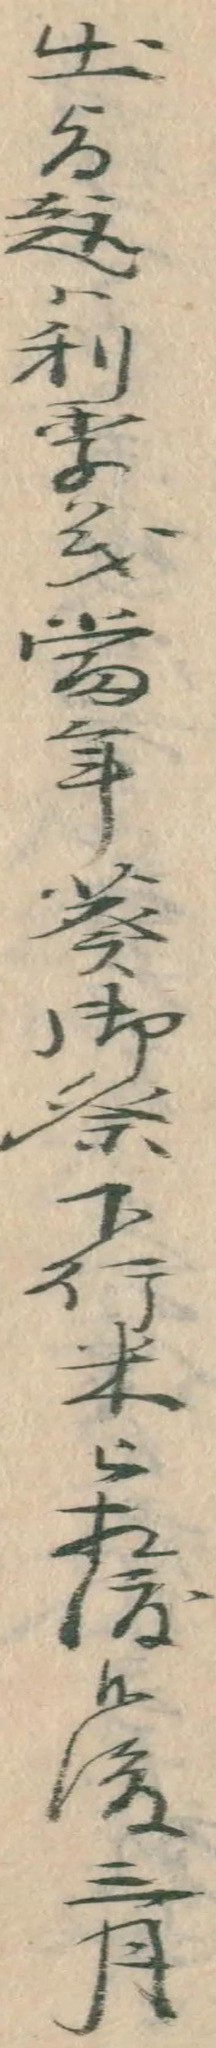出旨趣ハ利季義当年葵御祭下行米被相渡候後三月
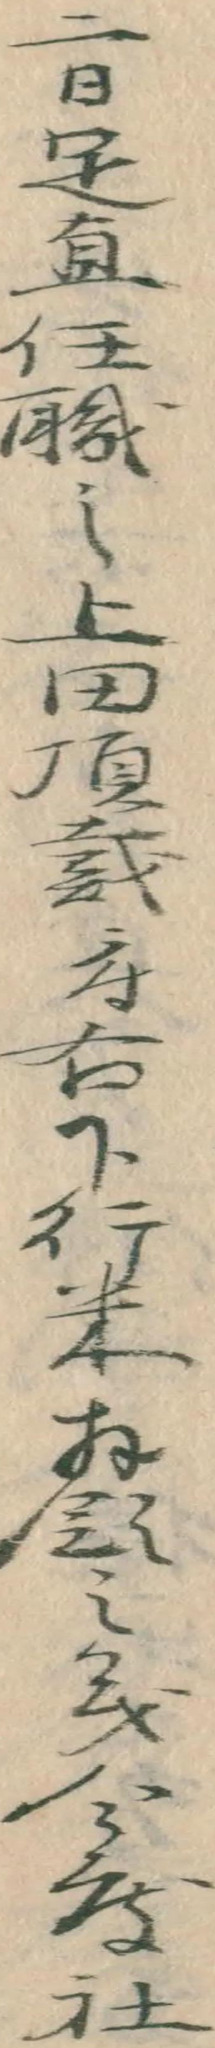二日足直任職之上田頂戴ニ付右下行米拝領之義今度社
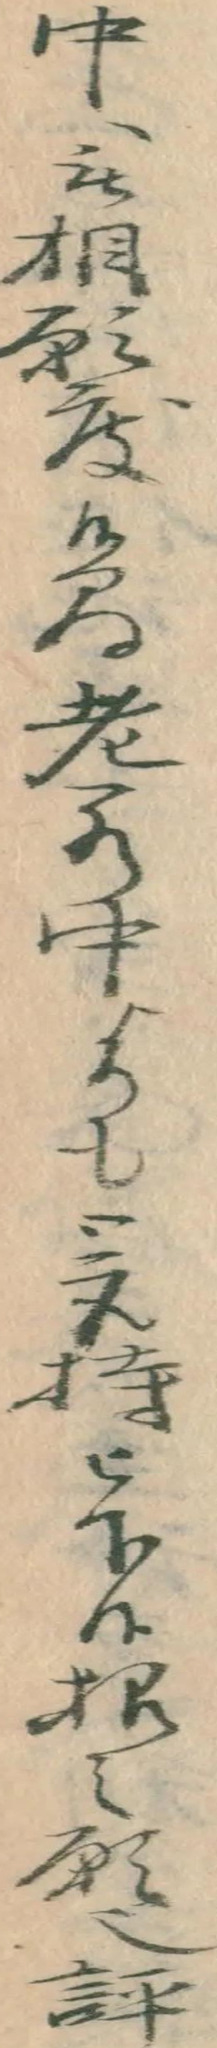中へ被相願度候間老若中ゟも御取持被下候様之願也かた

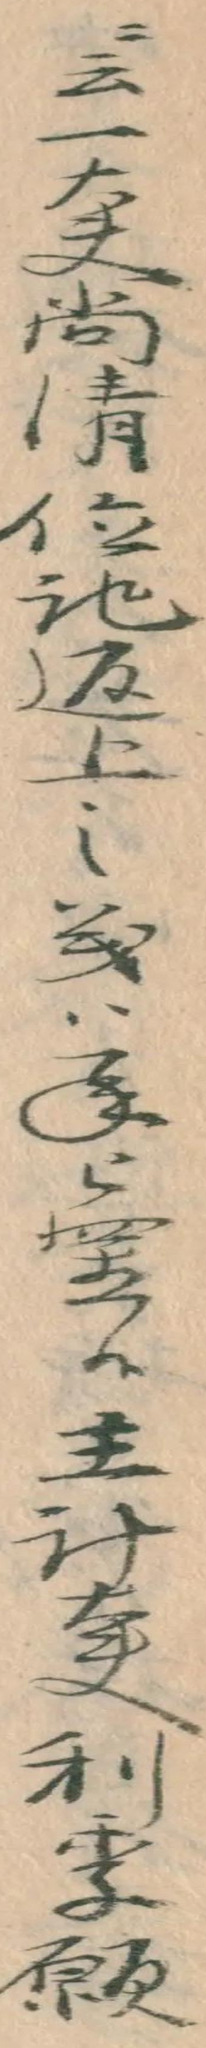ニ云一大夫尚清位記返上之義ハ承被置候主計大夫利季願
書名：賀茂社記録. 第64冊
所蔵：国立国会図書館 National Diet Library, JAPAN
